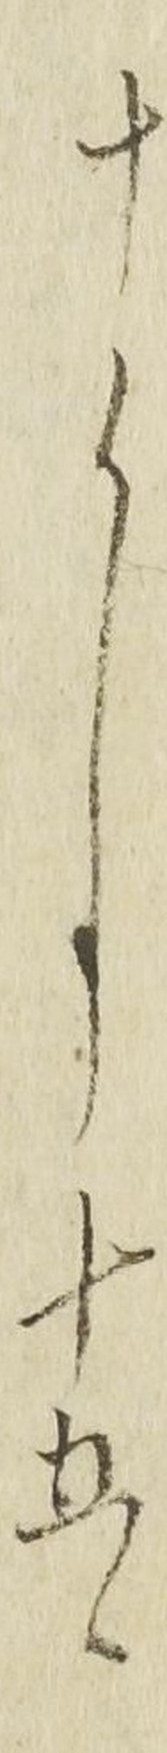十月十三日
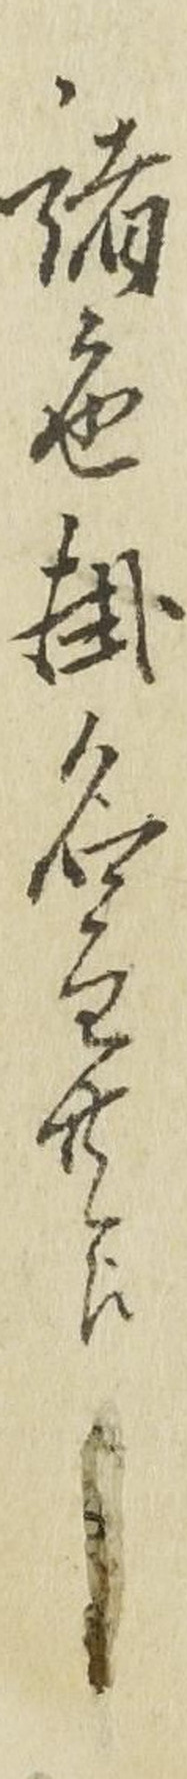諸色掛名主共え
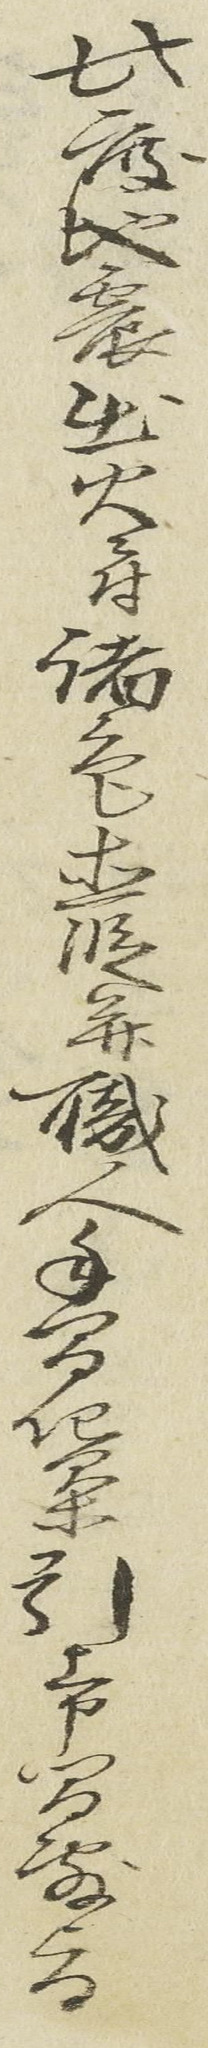此度地震出火二付諸色直段幷職人手間賃等引上申間敷旨
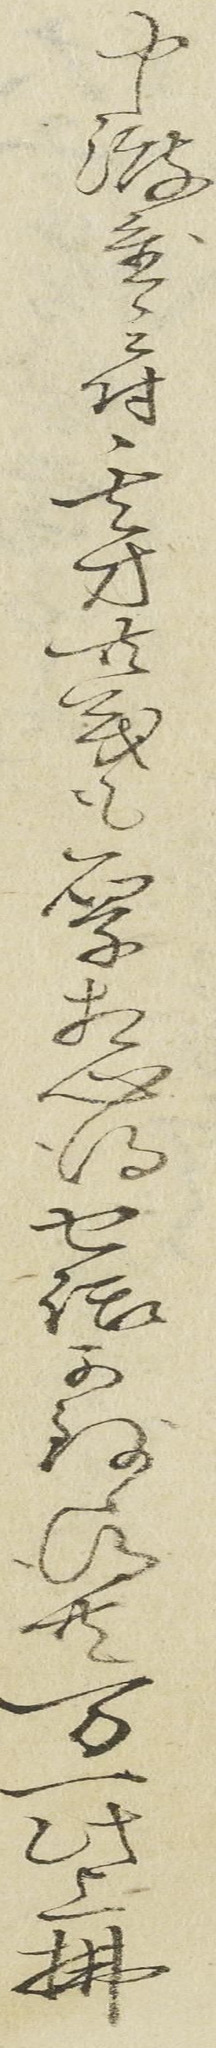申渡置候二付其方共義も厚相心得セ話可致候得共万一此上払
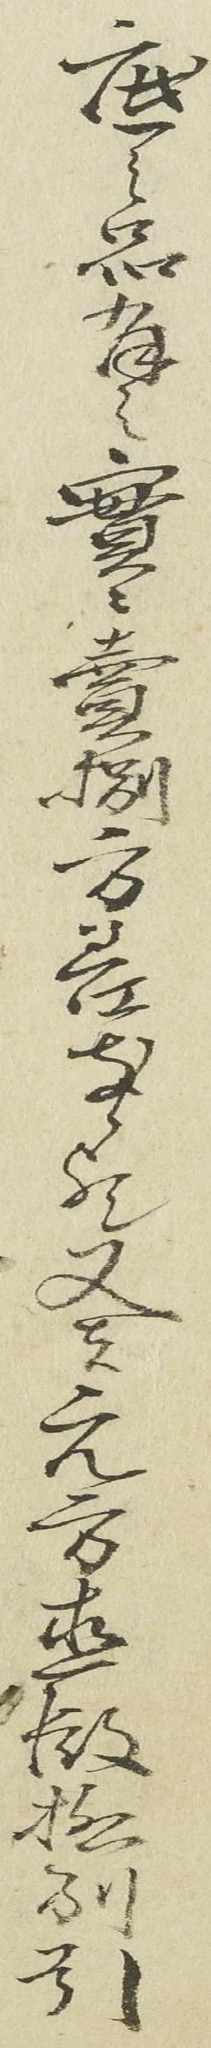底之品有之実二売捌方差支候歟又は元方直段格別引
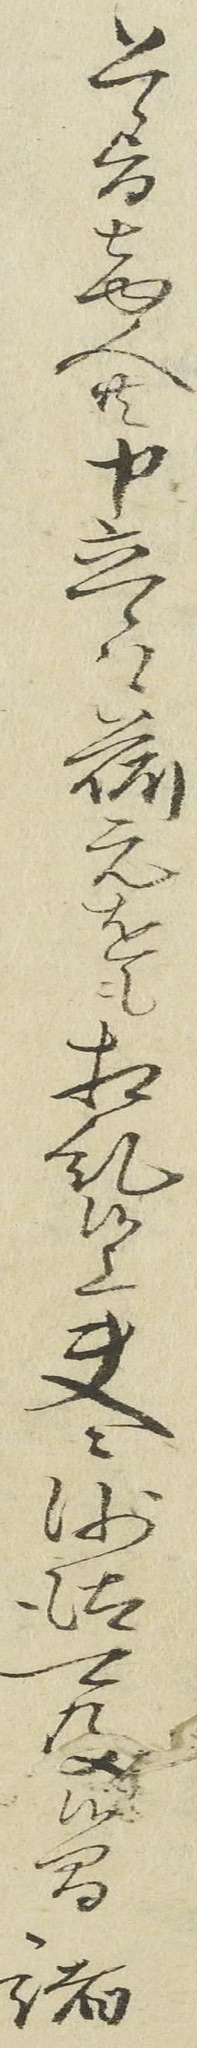上候旨商人共申立候ハゝ荷元をも相糺候上夫々沙汰可及候間諸
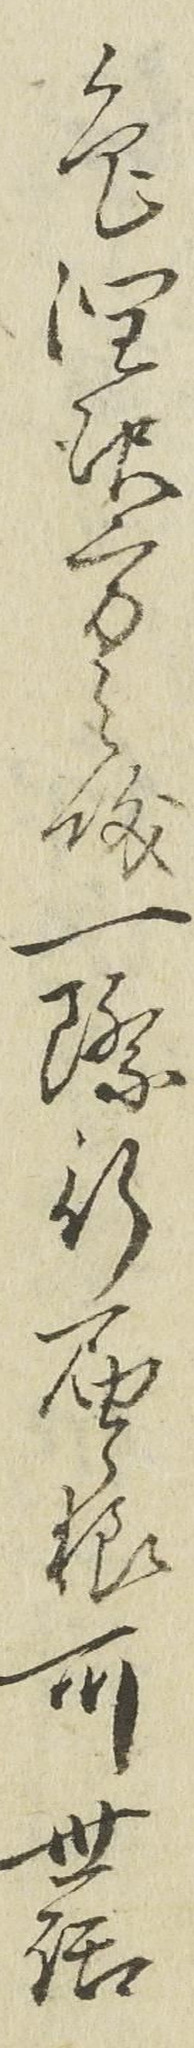色潤沢方之儀一際行届候様可世話

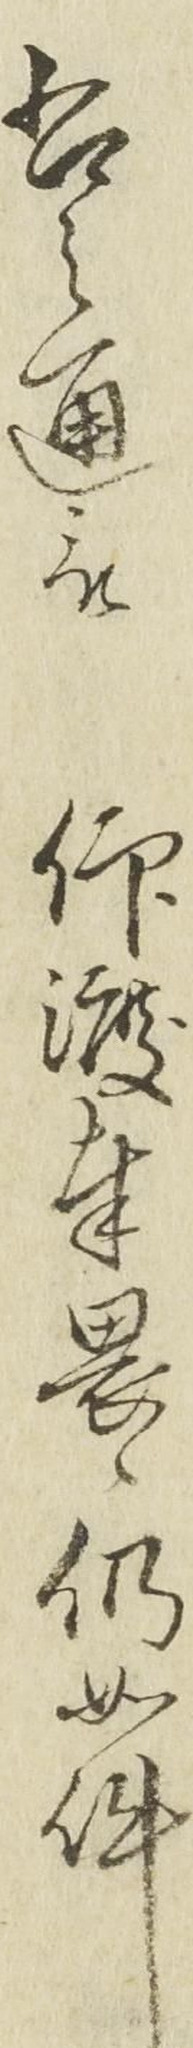右之通被仰渡奉畏候仍如件
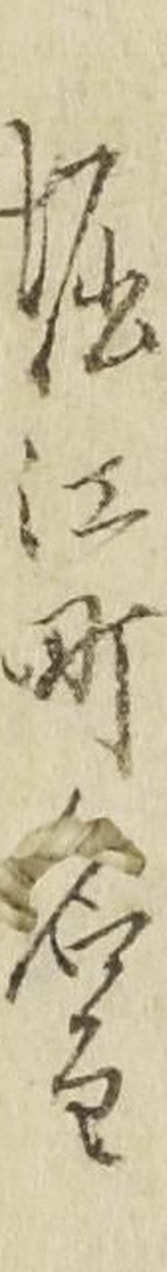堀江町名主
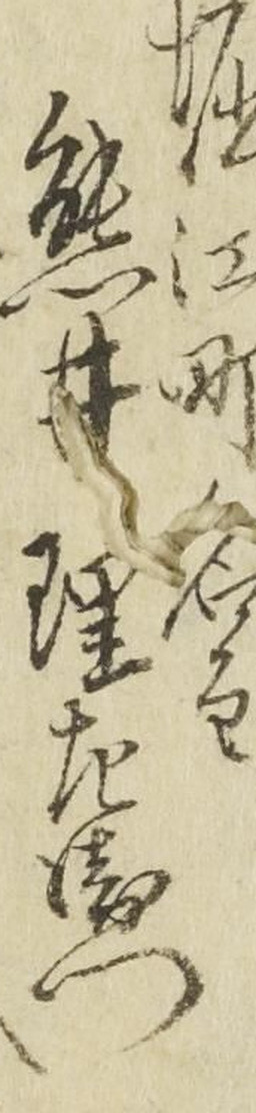熊井理左衛門
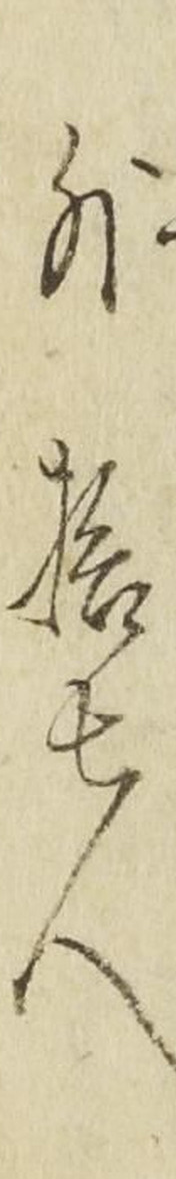外拾七人
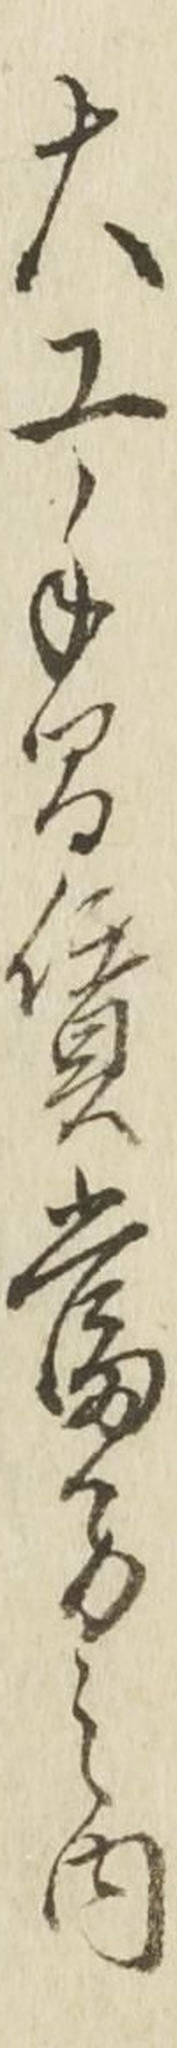大工手間賃当方之内
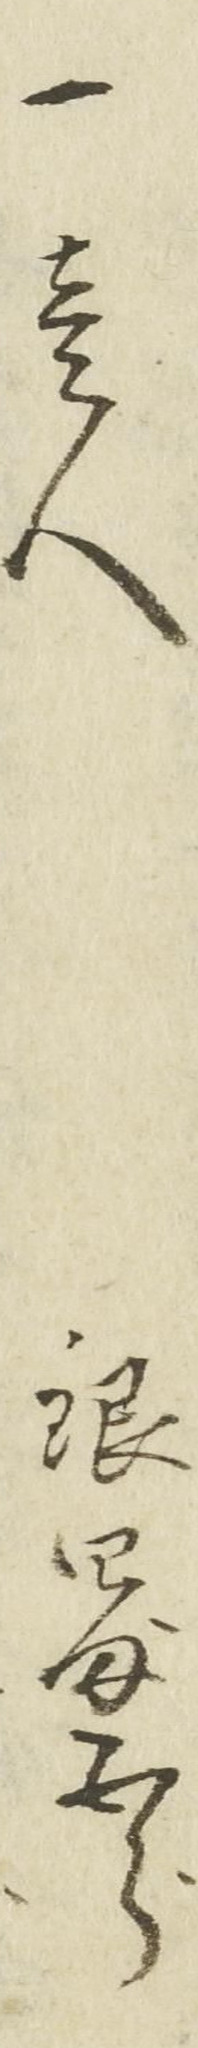一壱人銀四匁五分
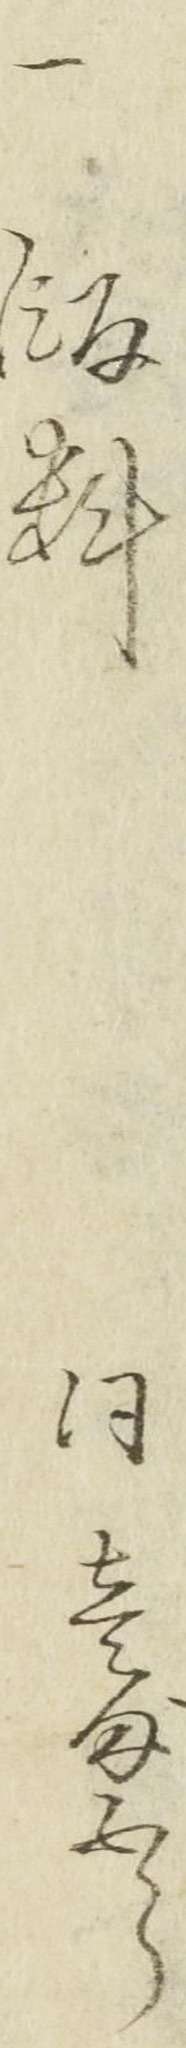一飯料同壱匁五分
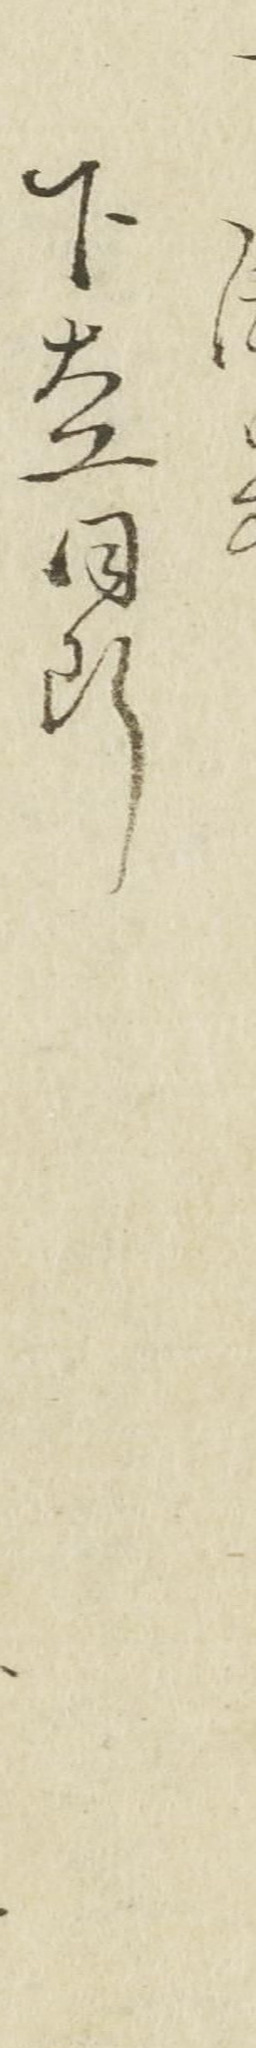下大工同断
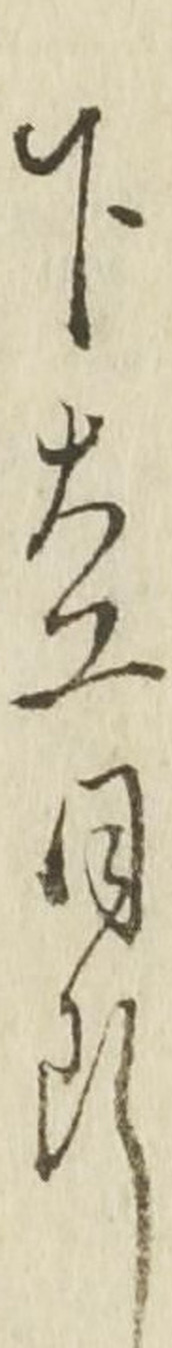下大工同断
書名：安政二乙卯年十月二日大地震之事
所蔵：東京大学地震研究所図書室 Earthquake Research Institute Library, The University of Tokyo, JAPAN
